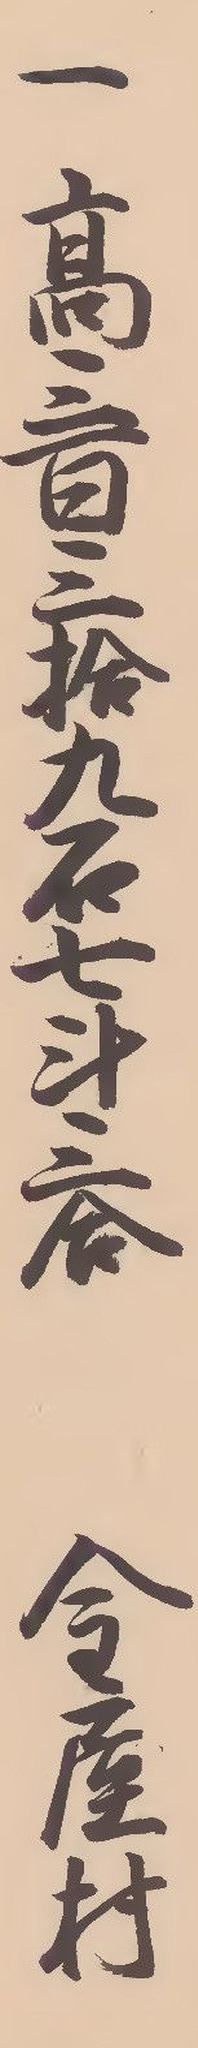一高三百三拾九石七斗三合金屋村

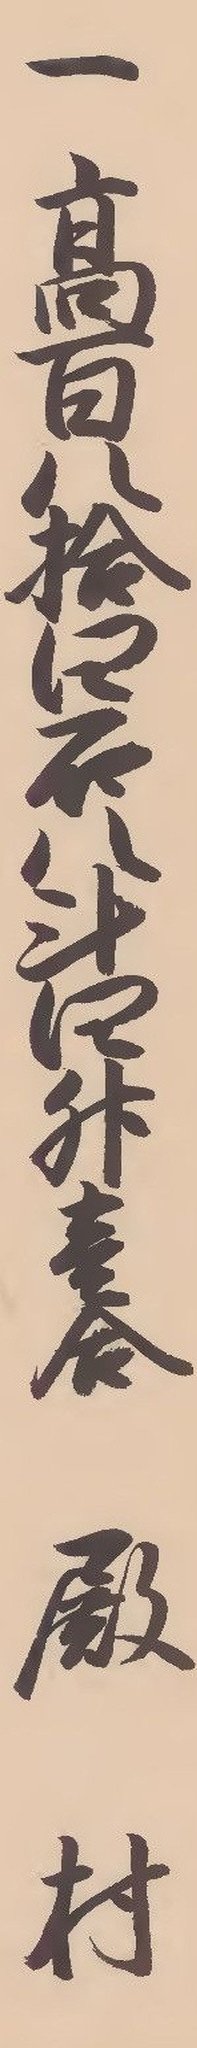一高百八拾四石八斗四升壱合殿村
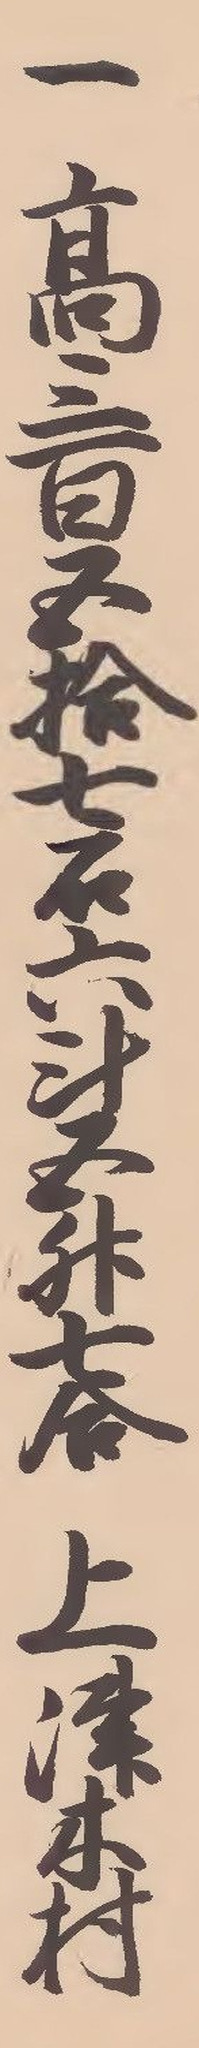一高三百五拾七石六斗五升七合上津木村
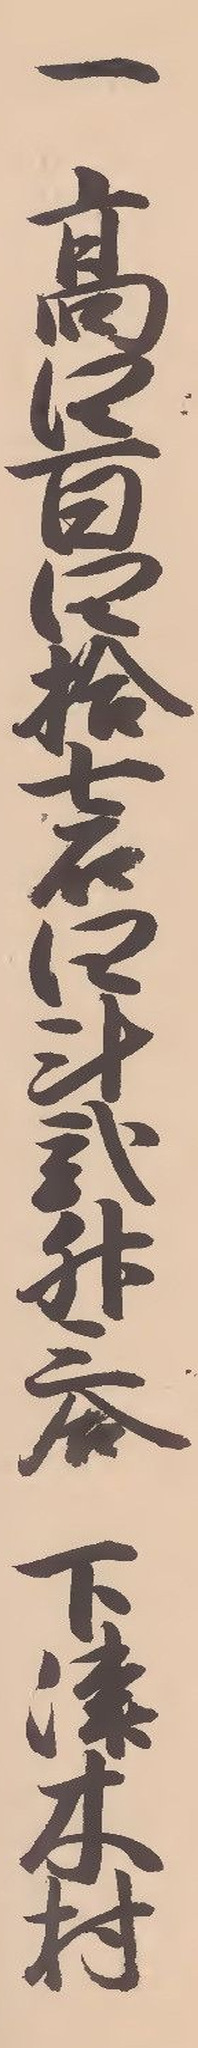一高四百四拾七石四斗弐升三合下津木村
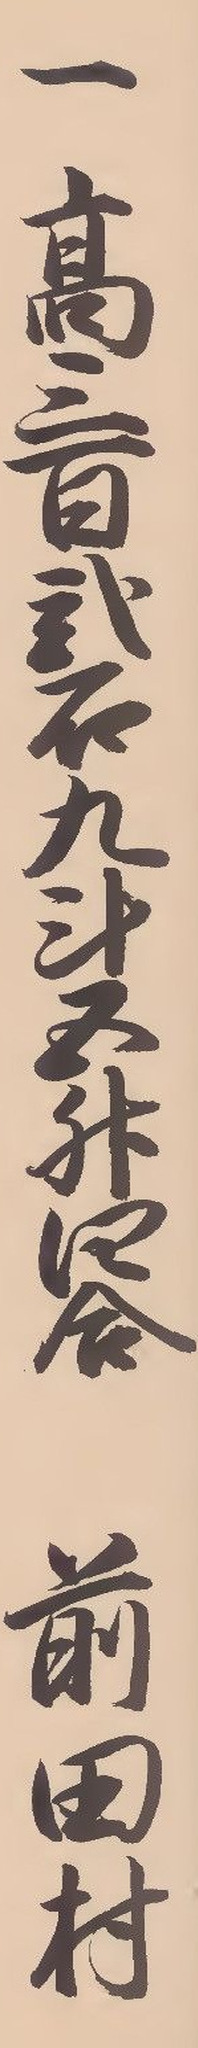一高三百弐石九斗五升四合前田村
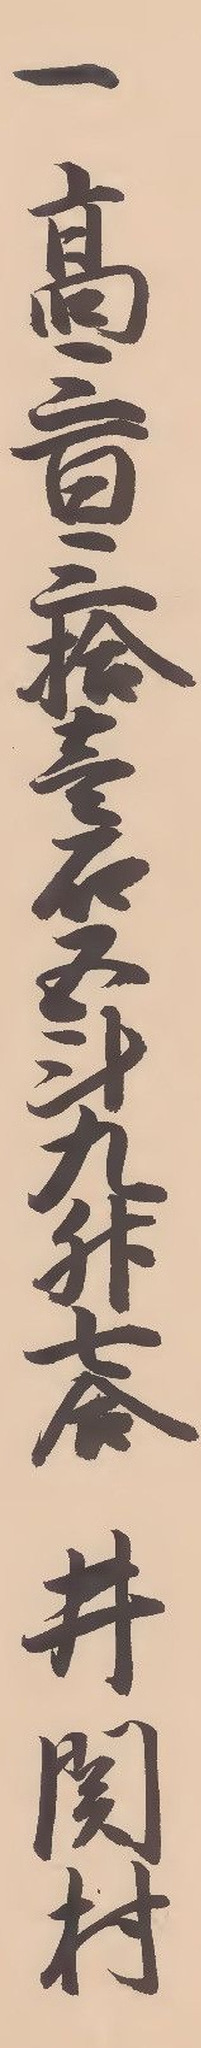一高三百三拾壱石五斗九升七合井関村
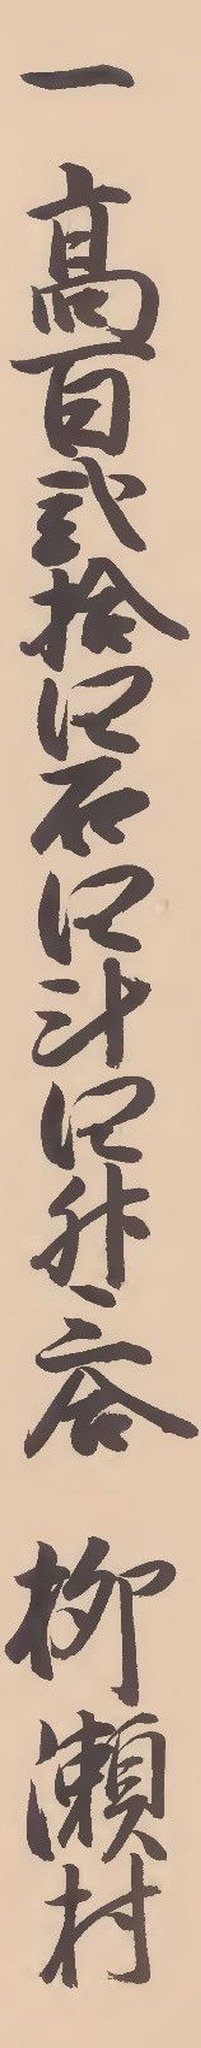一高百弐拾四石四斗四升三合柳瀬村
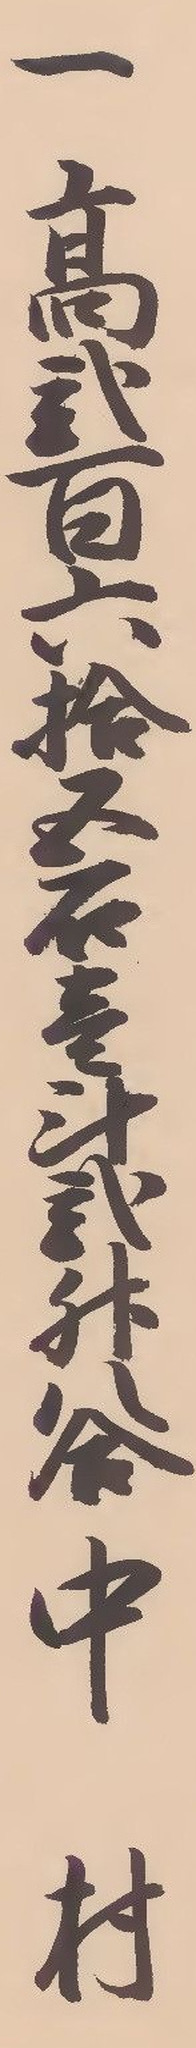一高弐百六拾五石壱斗弐升八合中村

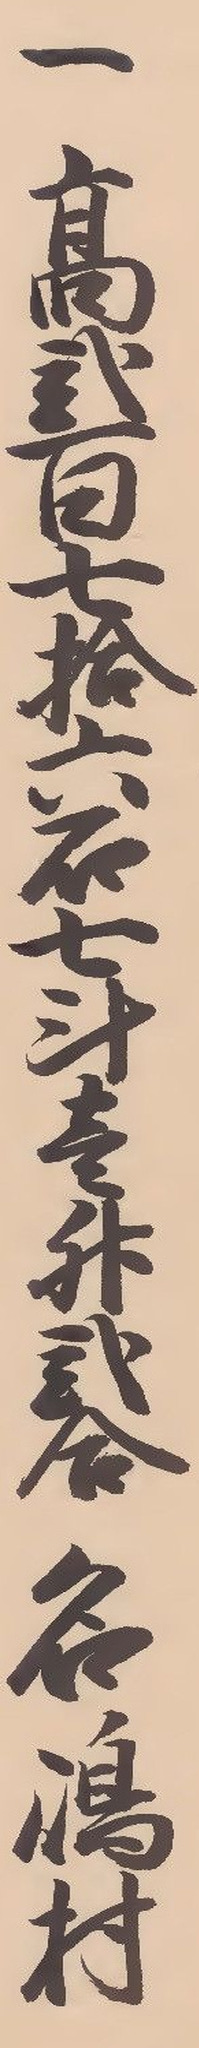一高弐百七拾六石七斗壱升弐合名島村
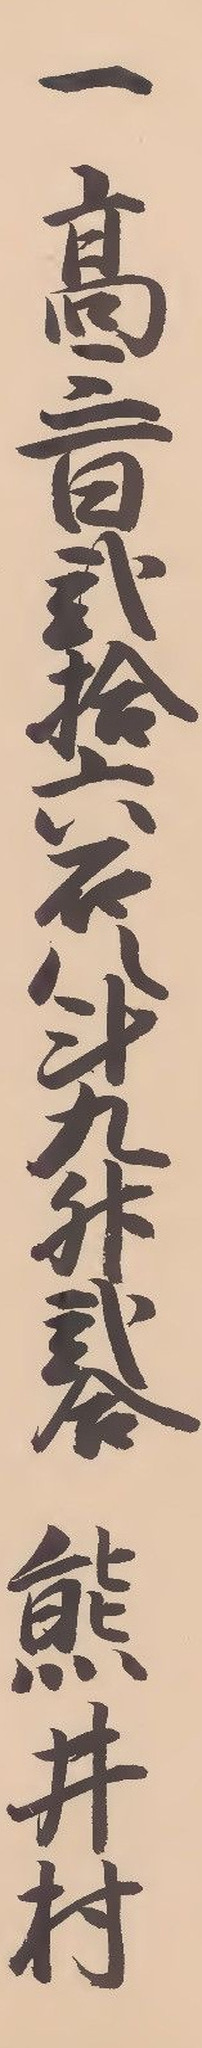一高三百弐拾六石八斗九升弐合熊井村
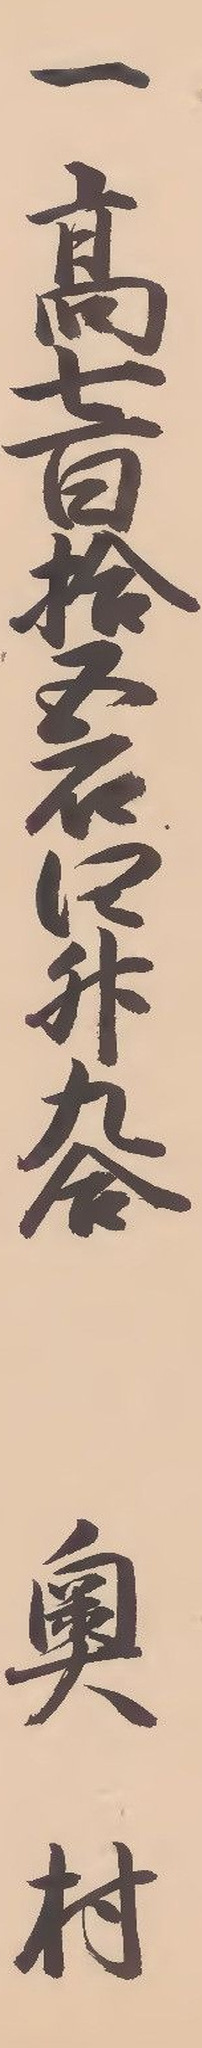一高七百拾五石四升九合奥村
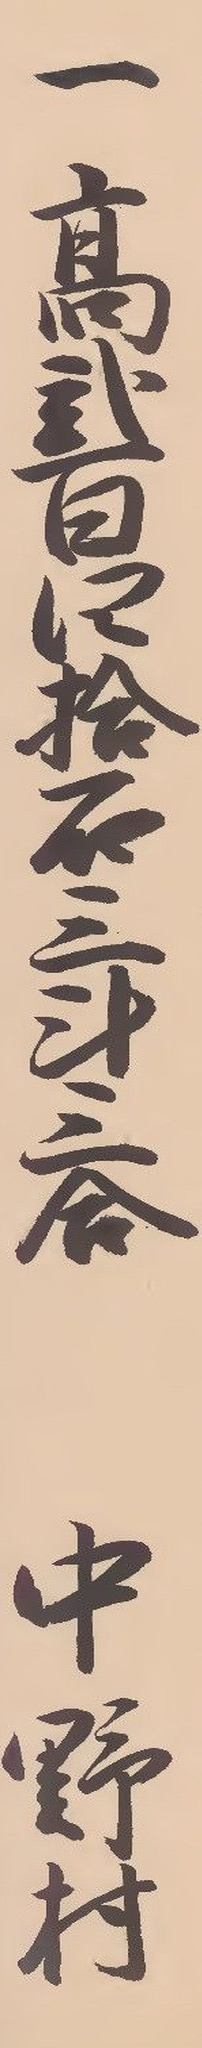一高弐百四拾石三斗三合中野村
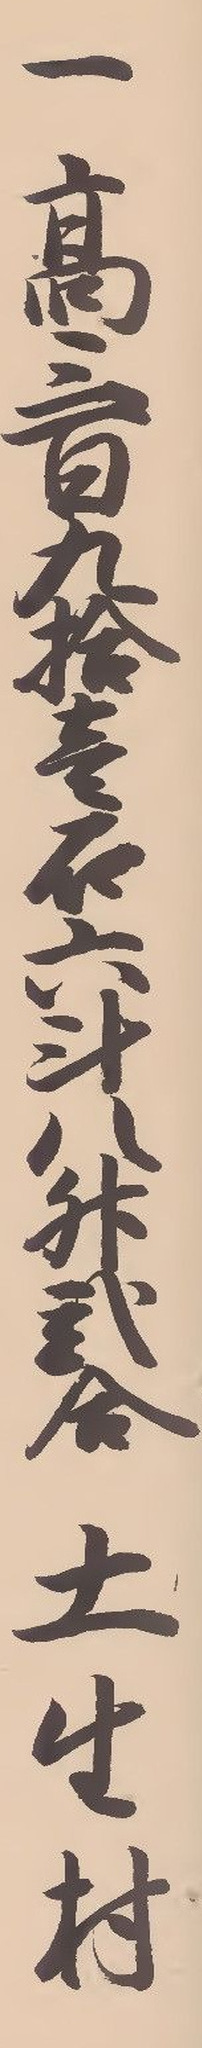一高三百九拾壱石六斗八升弐合土生村
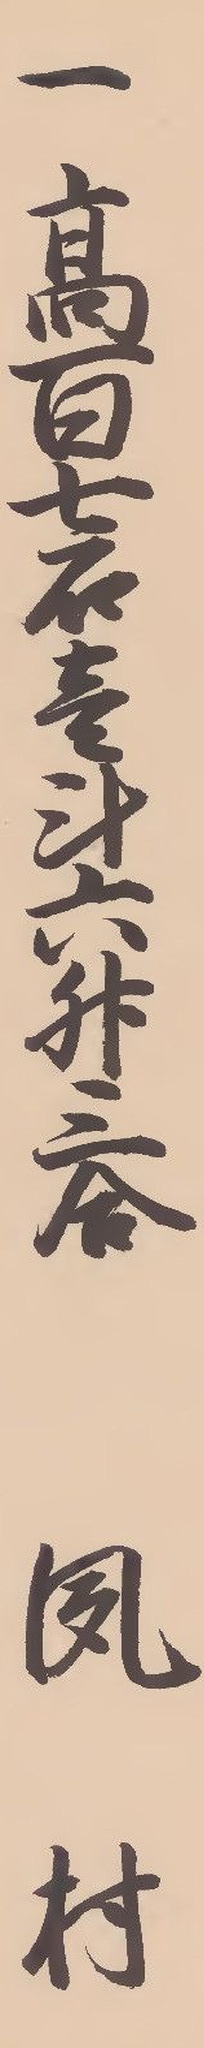一高百七石壱斗六升三合夙村
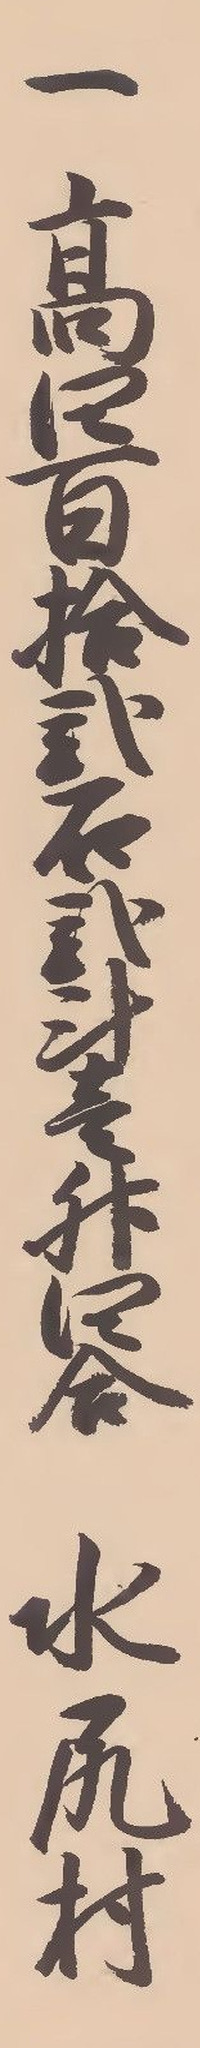一高四百拾弐石弐斗壱升四合水尻村
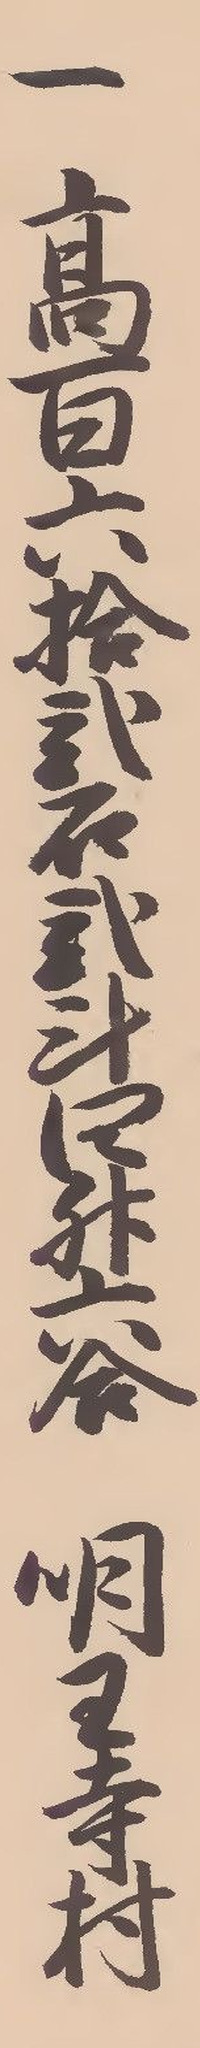一高百六拾弐石弐斗四升六合明王寺村
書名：紀伊国郷帳
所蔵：国立公文書館 National Archives of Japan
